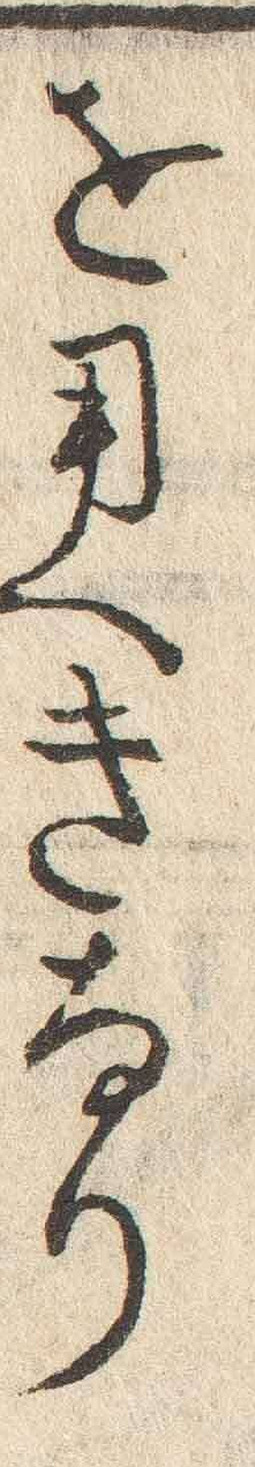を用へきなり
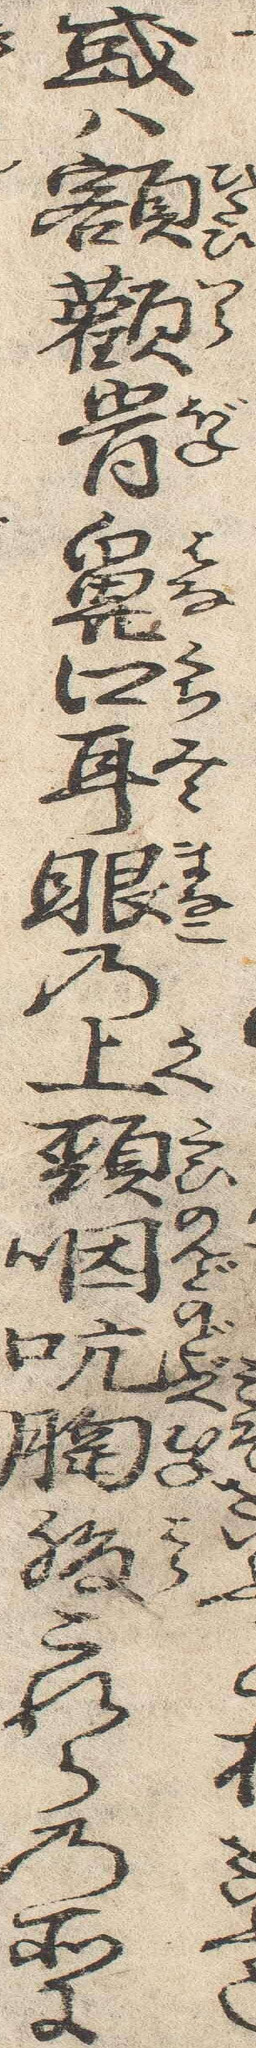或は額顴骨鼻口耳眼の上頸咽吭胸腹これらの所に
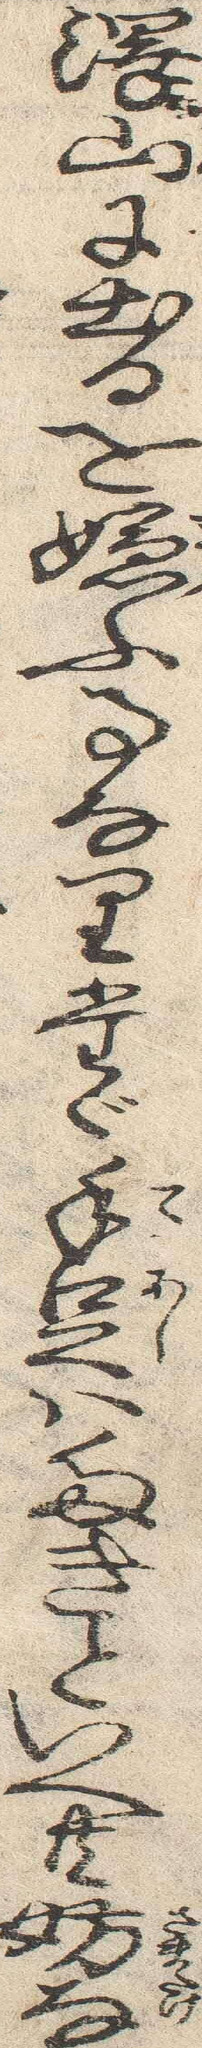沢山に出るを嫌ふ事なりたゞ手足は多きといへ共妨な
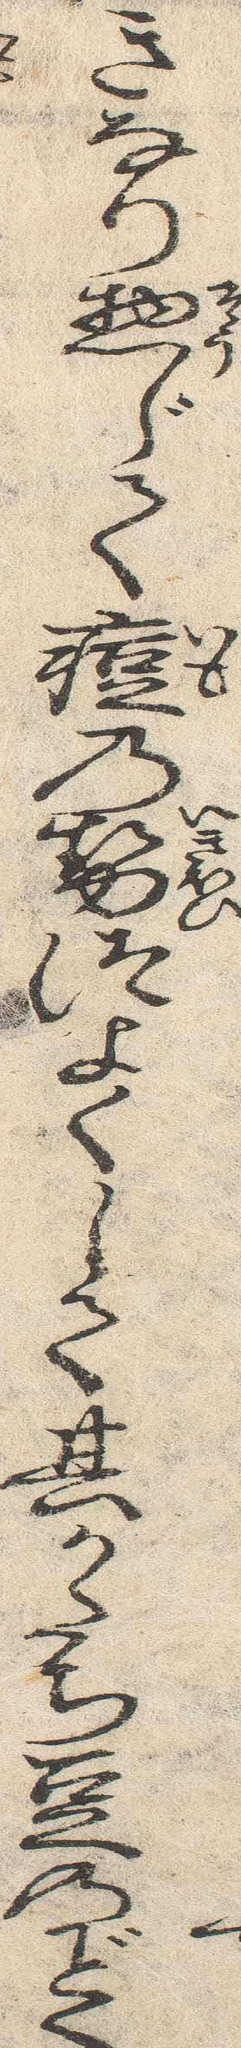きなり総じて痘の勢つよくして其かたち豆のごとく
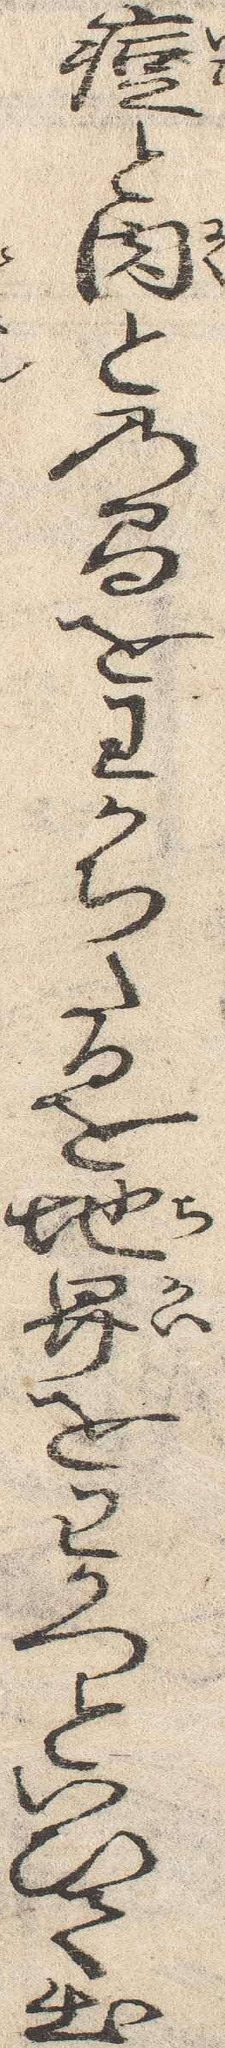痘と肉との間をわかちたるを地界をわかつといひて出
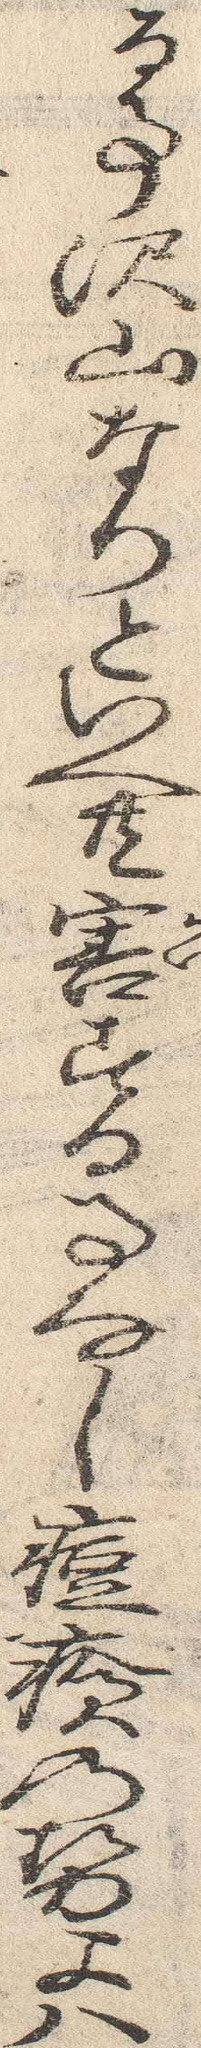る事沢山なりといへ共害する事なし痘瘡の勢よは
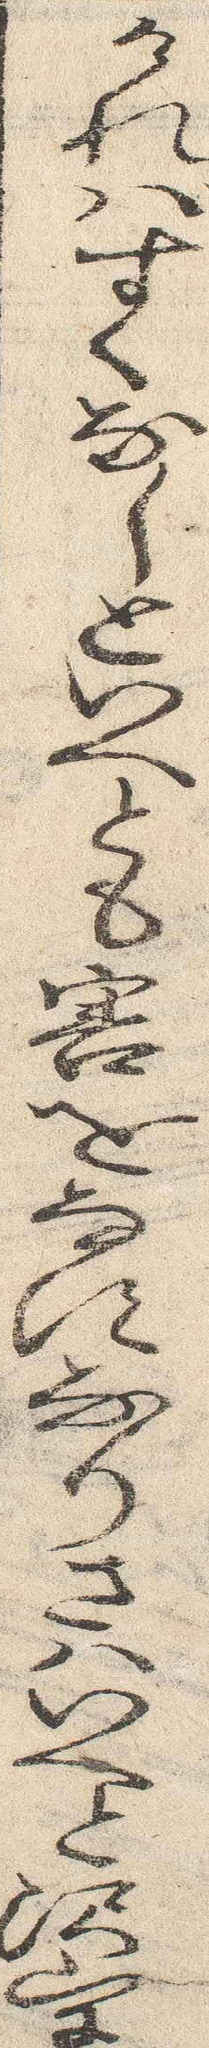ければすくなしといへとも害をなすなりさはいへと沢山に
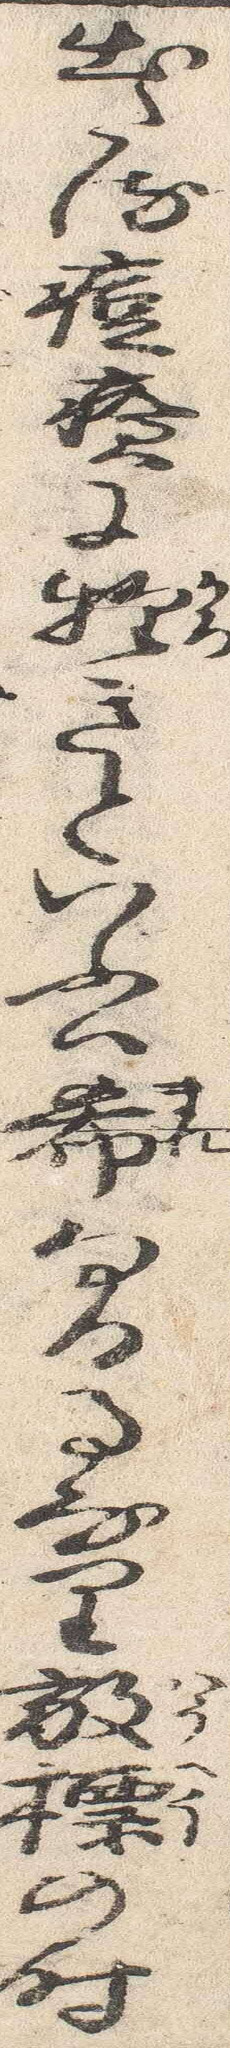出たる痘瘡に軽きといふは希なる事なり放標の時
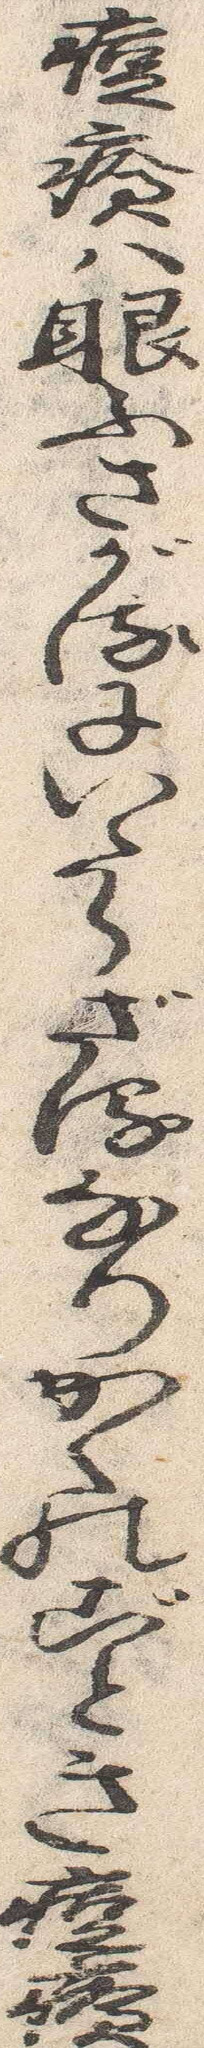痘瘡は眼ふさがるにいたらざるなりかくのごとき痘瘡
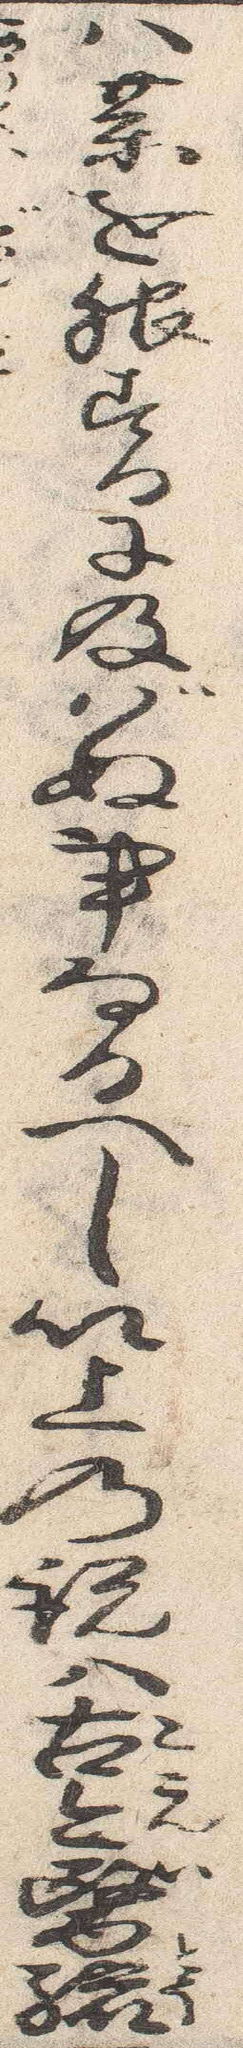は薬を服するに及ばぬ事なるへし以上の説は古今医統
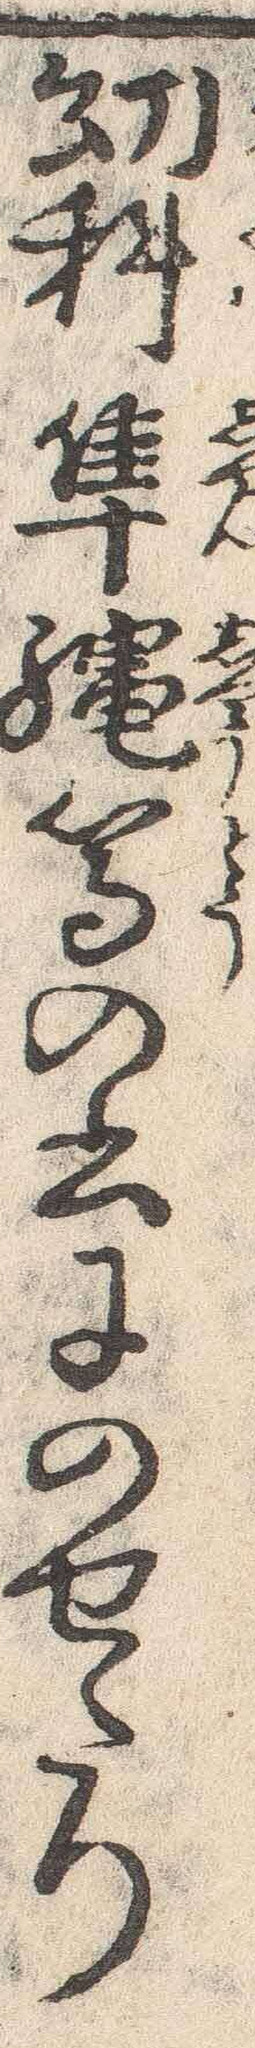幼科準縄等の書にのせたり
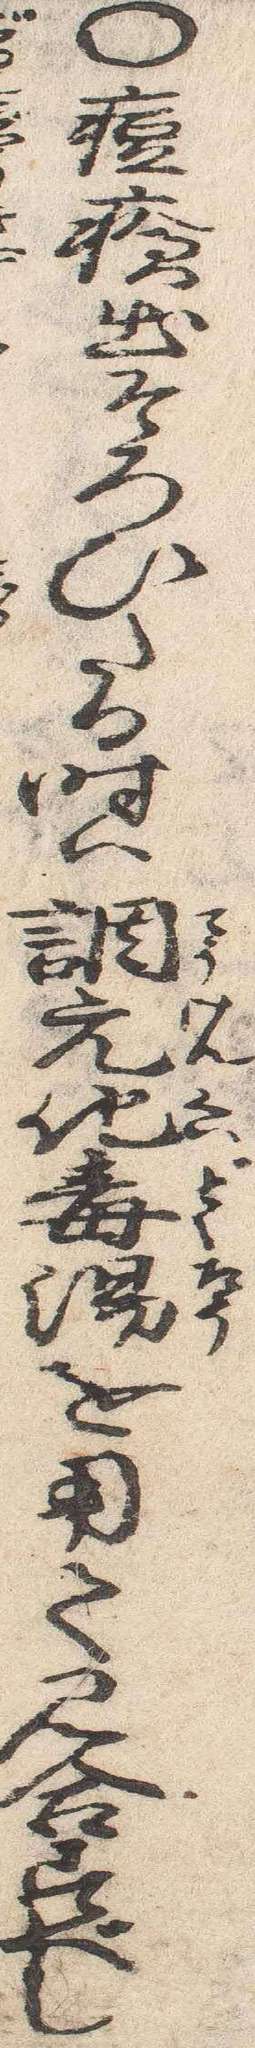○痘瘡出そろひたる時は調元化毒湯を用て見合すべし
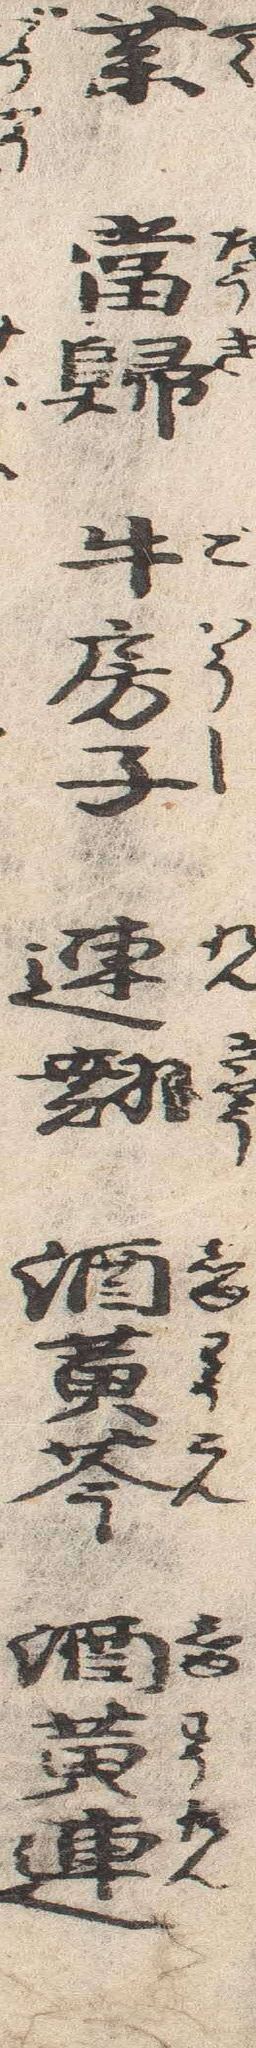薬当帰牛房子連翹酒黄芩酒黄連
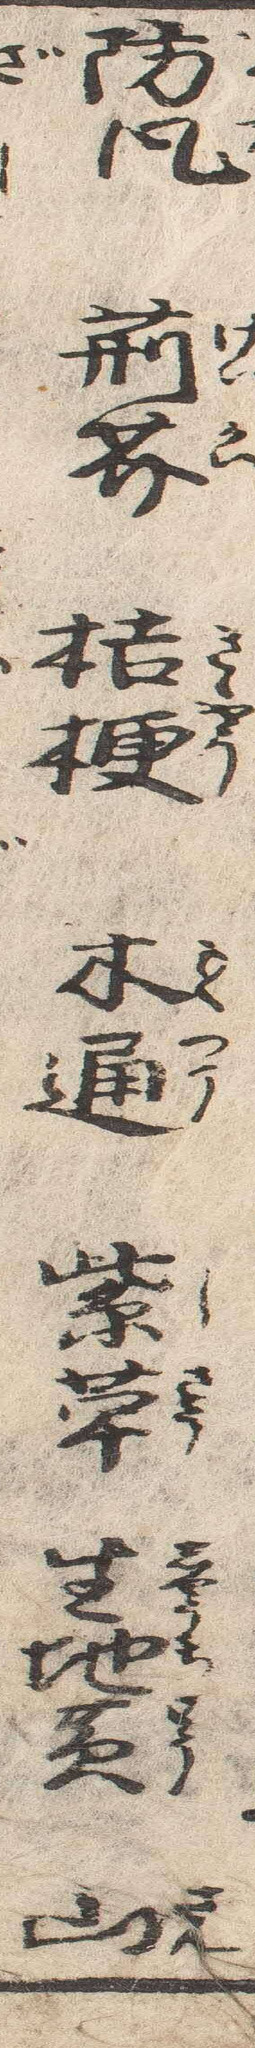防風荊芥桔梗木通紫草生地黄山
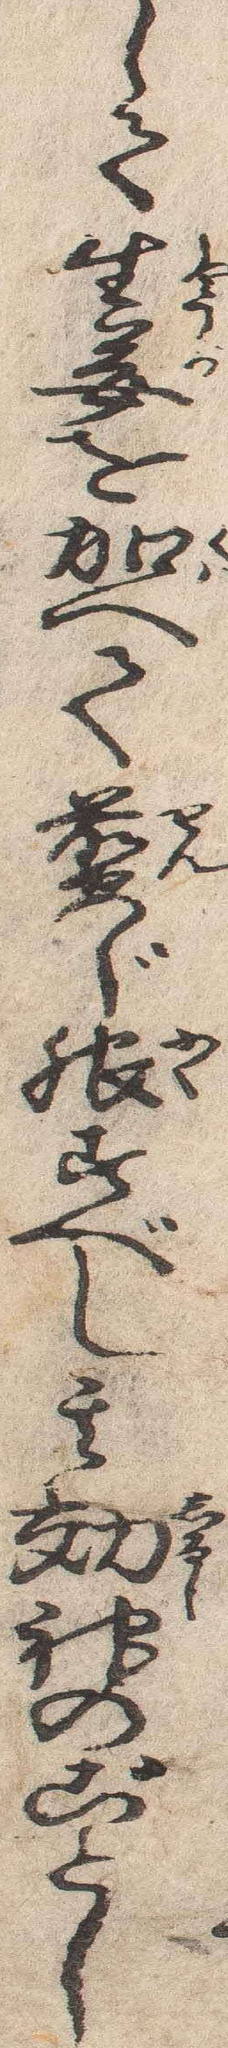して生姜を加へて煎じ服すべし其効神のごとし

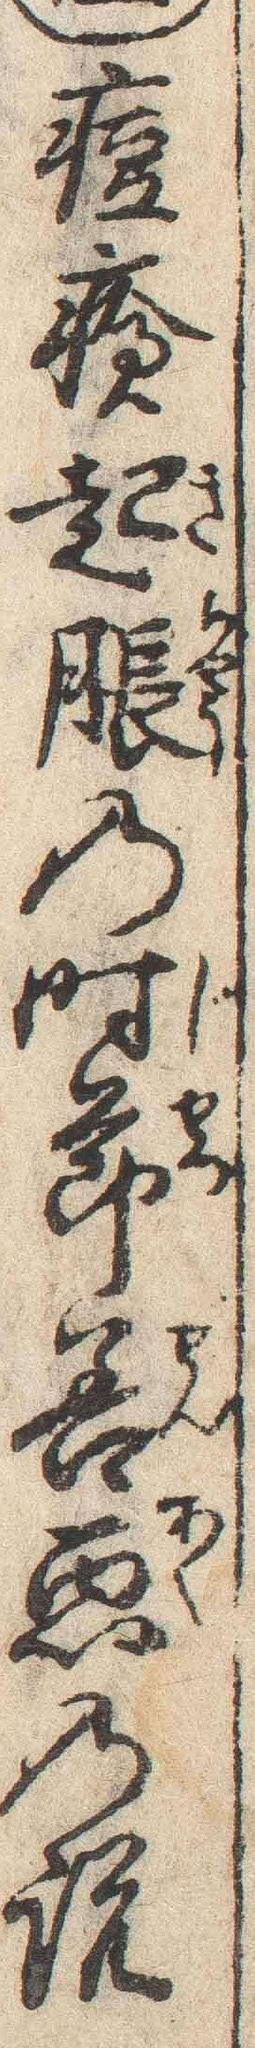(十四)痘瘡起脹の時節善悪の説
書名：小児必用養育草
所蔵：東京学芸大学附属図書館 国文学研究資料館
